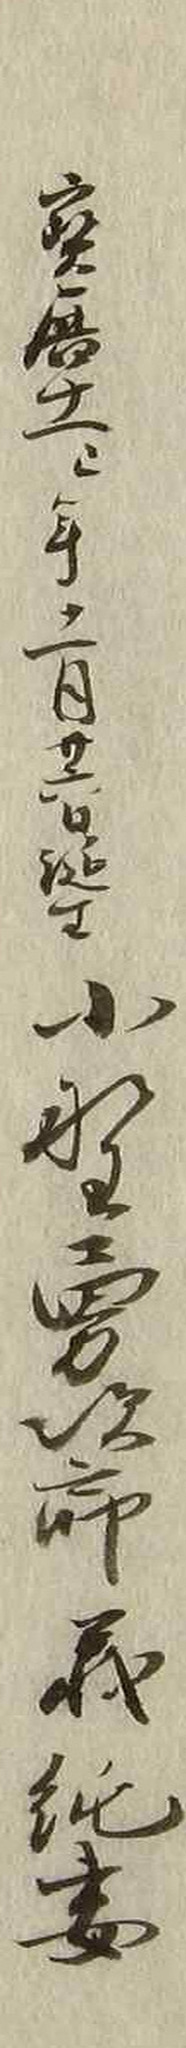宝暦十一巳年十一月廿六日誕生小野勇次郎義純妻
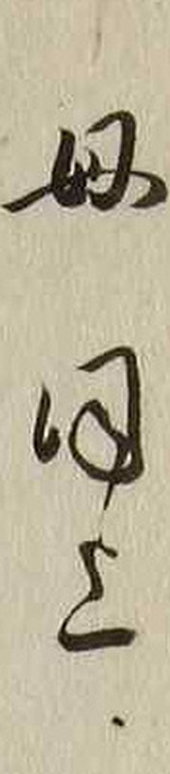母同上
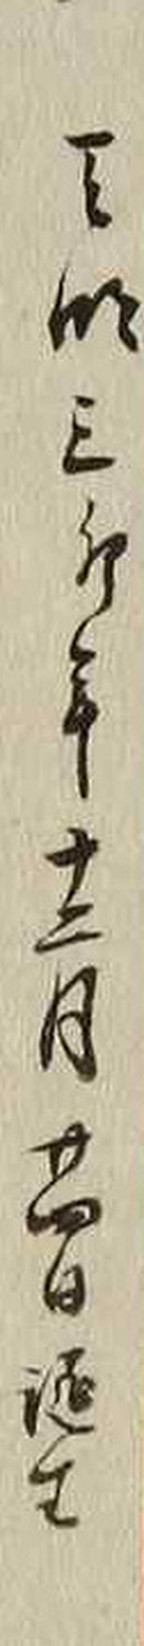天明三卯年十二月廿四日誕生
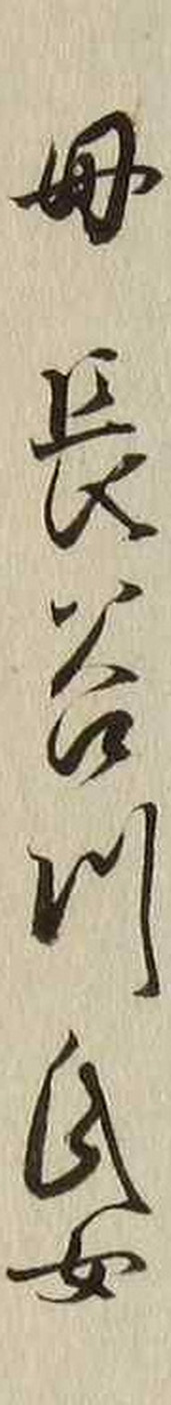母長谷川氏女
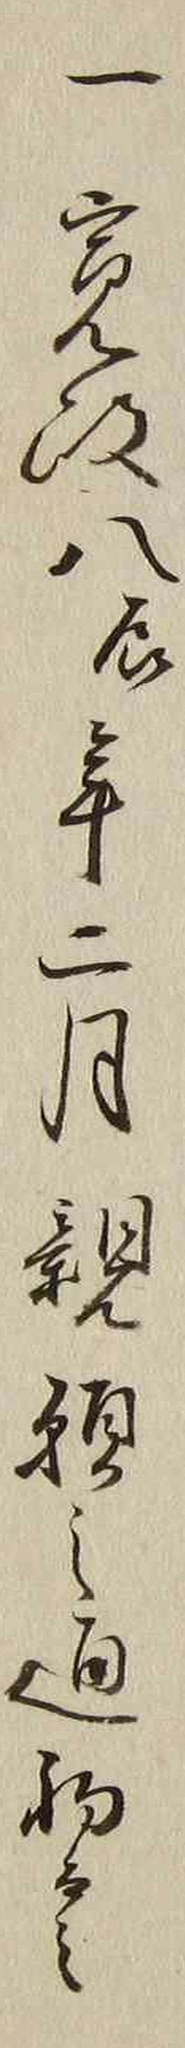一寛政八辰年二月親願之通初而之
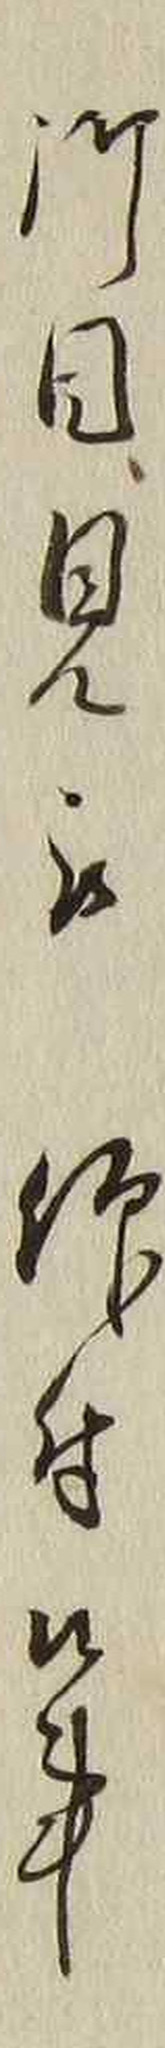御目見被仰付候事
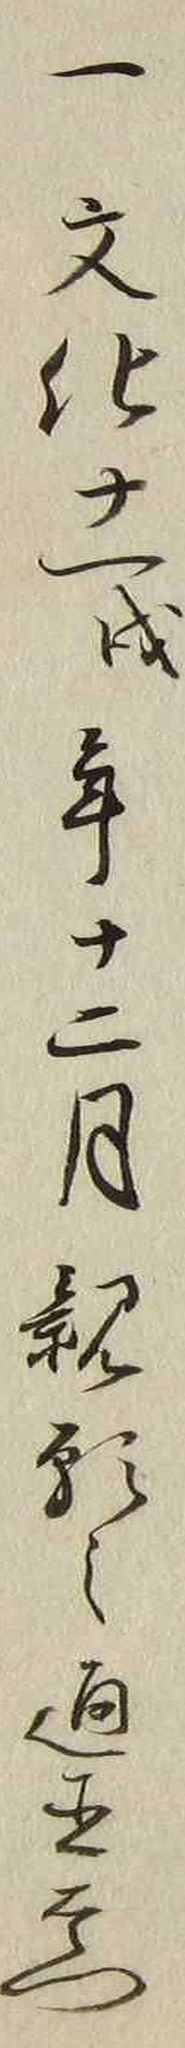一文化十一戌年十二月親願之通直右衛門
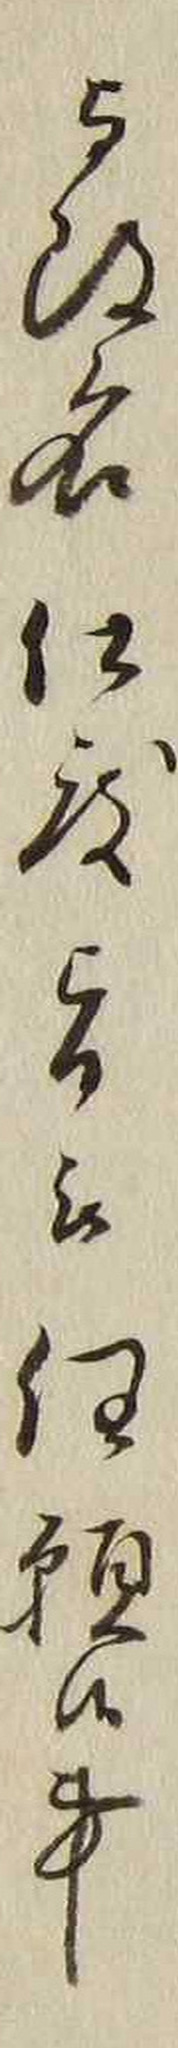与改名仕度旨被任願候事
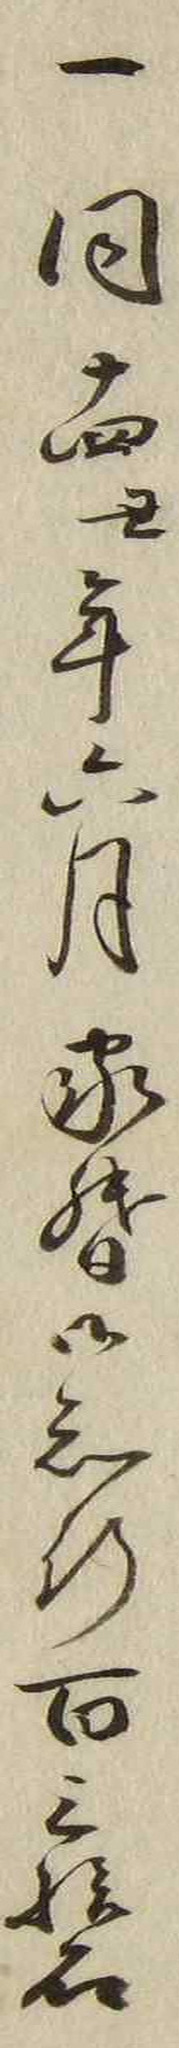一同十四丑年六月家督御知行百三拾石

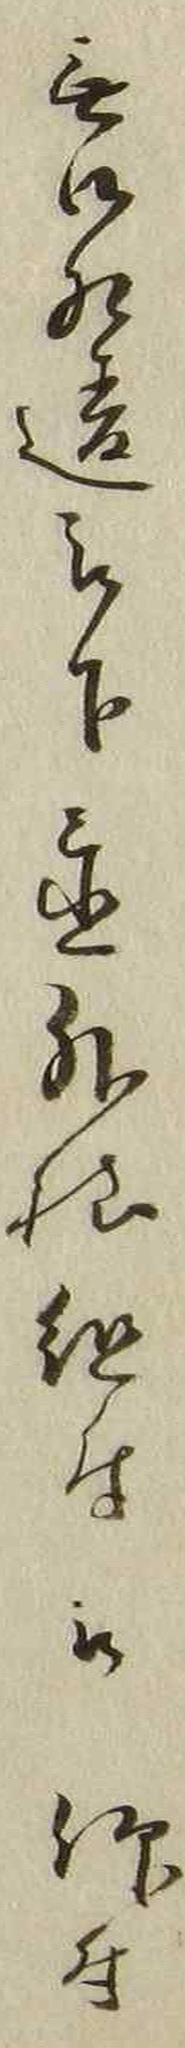無御相違被下置外様組付被仰付
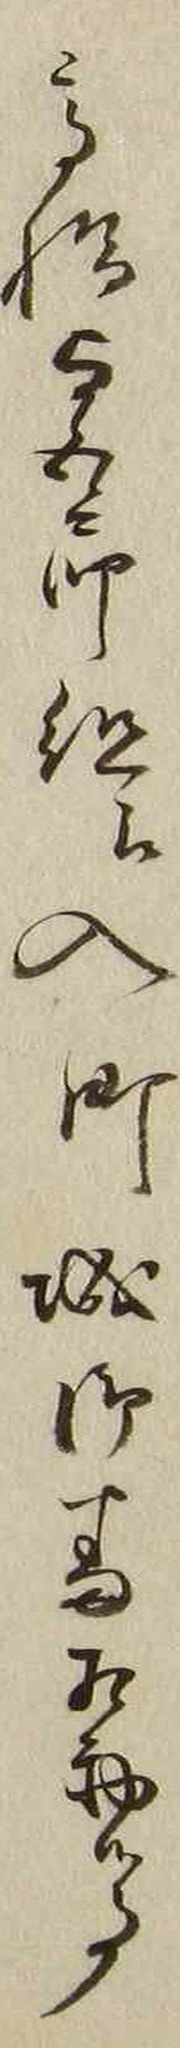高橋与五郎組江入御城御番相勤候事
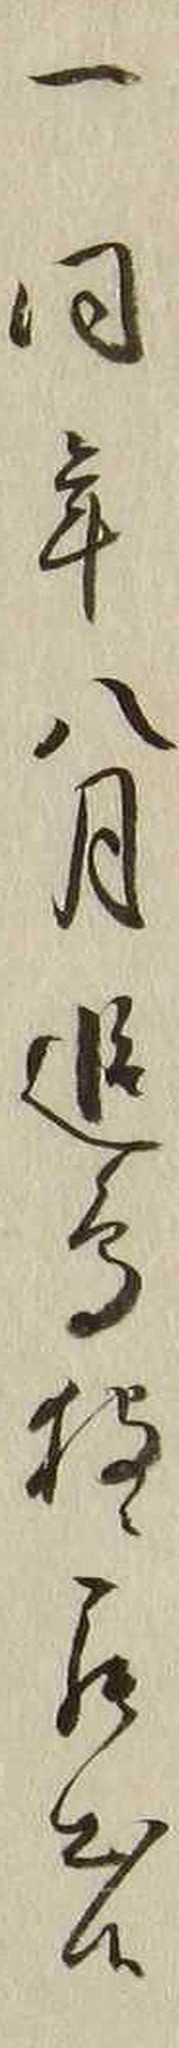一同年八月追鳥狩へ罷出候
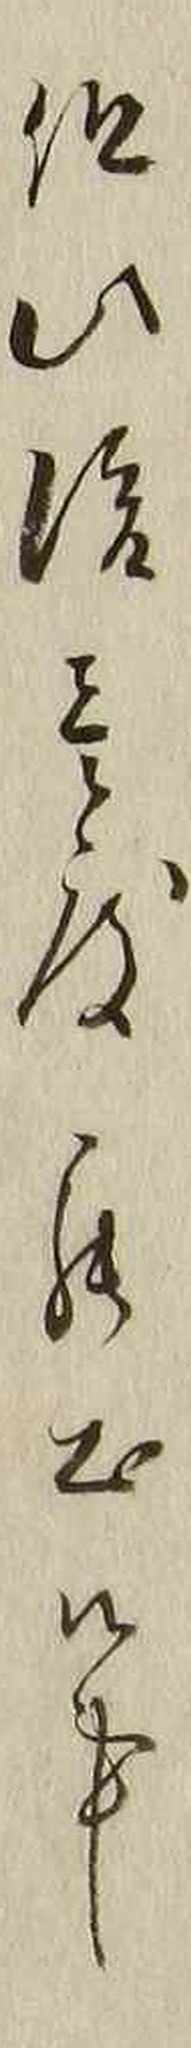但以後壱度罷出候事
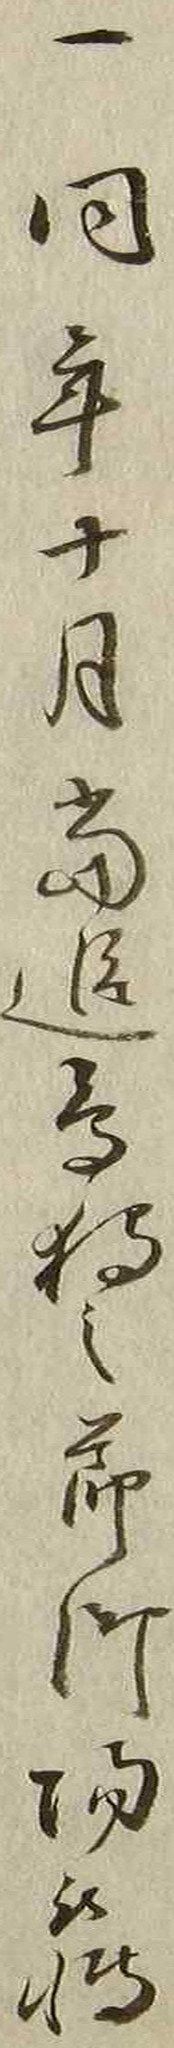一同年十月当追鳥狩之節御場被転
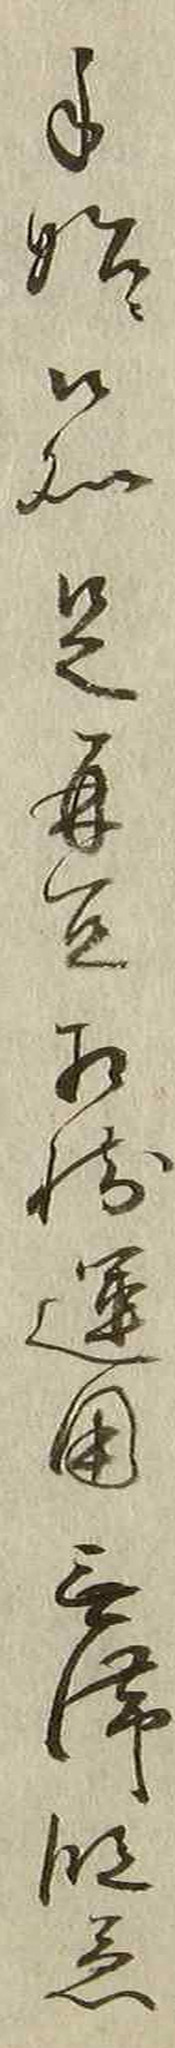手始ニ候処足并宜相揃運用無滞段兼
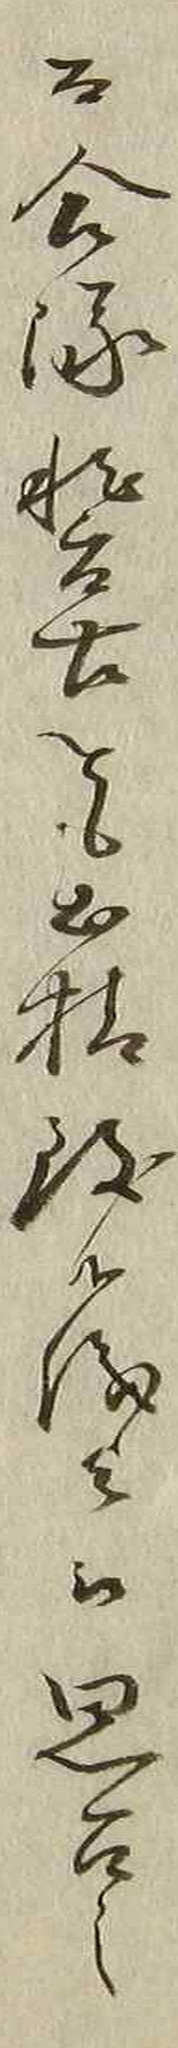而合隊稽古とも出精致候儀ニ被思召之
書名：諸士系譜　巻之25　い之部25
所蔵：会津若松市立会津図書館
